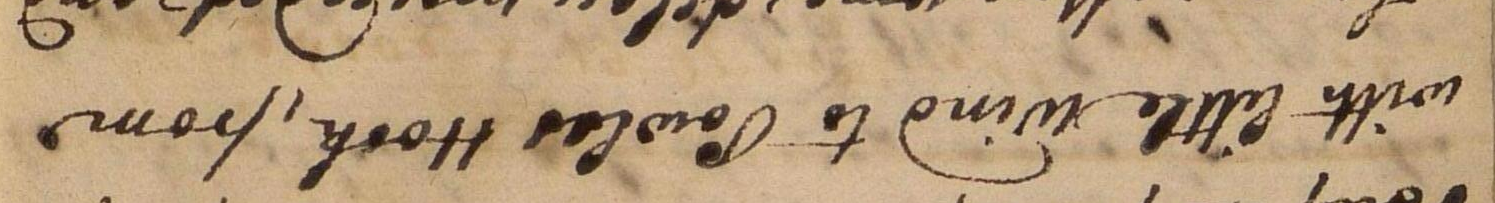with little Wind to Powles Hook, from
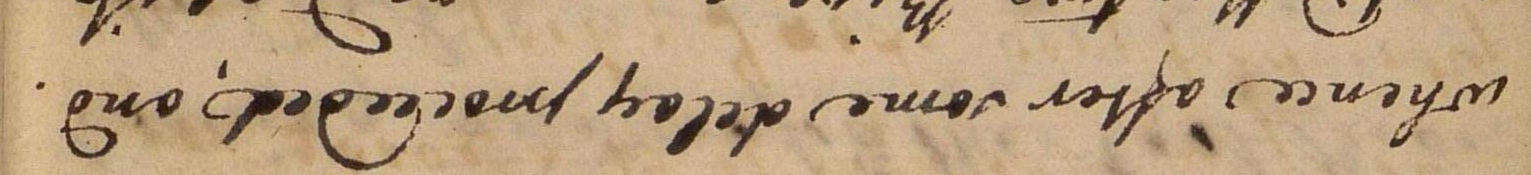whence after some delay proceeded, and.
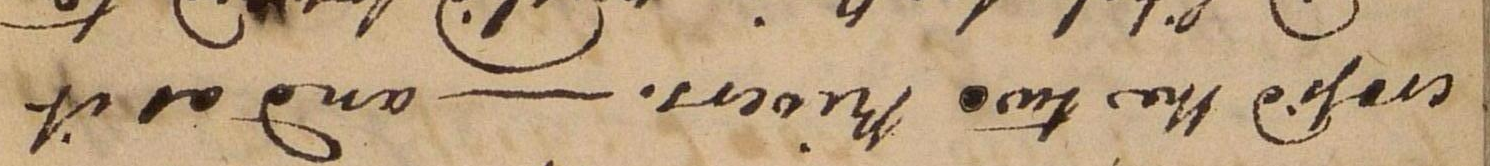cross'd the two Rivers.- and as it
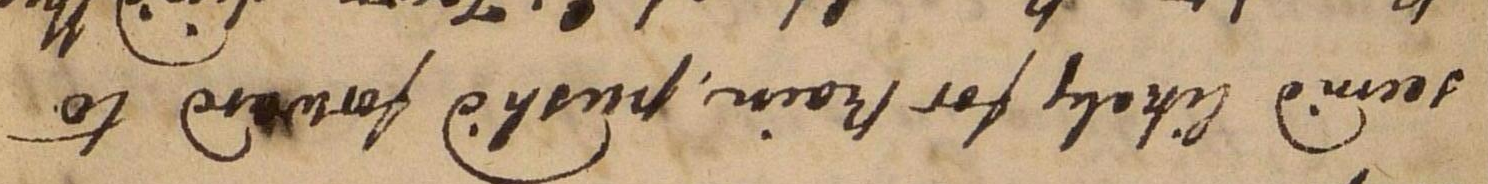seem'd likely for Rain, push'd forward to
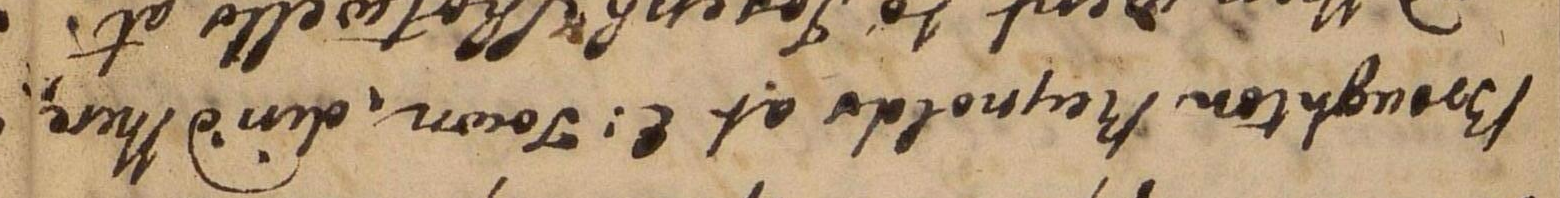Broughton Reynolds at E: Town. din'd there,
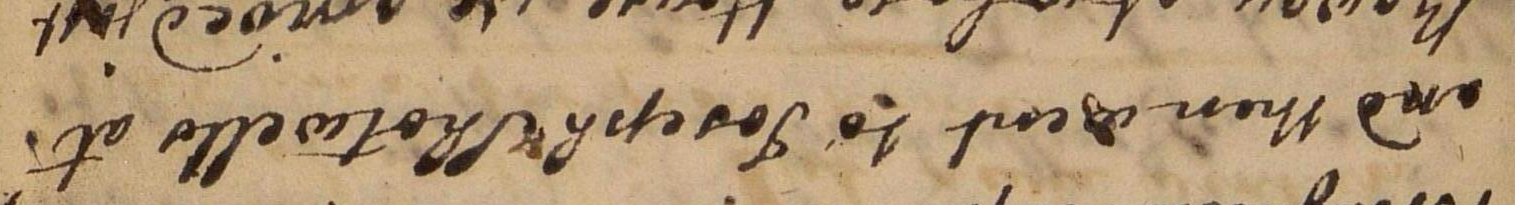and then went to Joseph Shotwells at
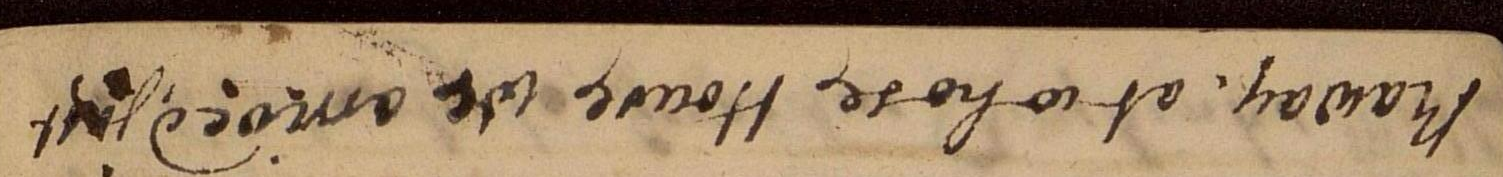Raway. at whose House we arrived just
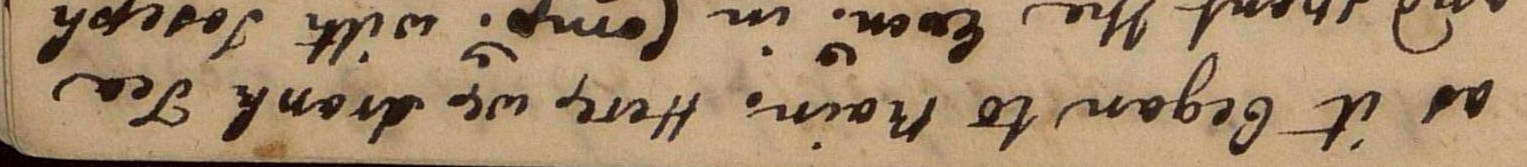as it began to Rain. Here we drank Tea
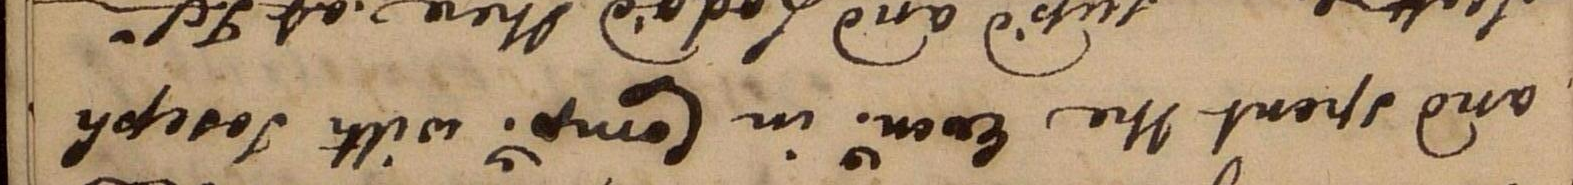and spent the Even^g. in Comp^y. with Joseph
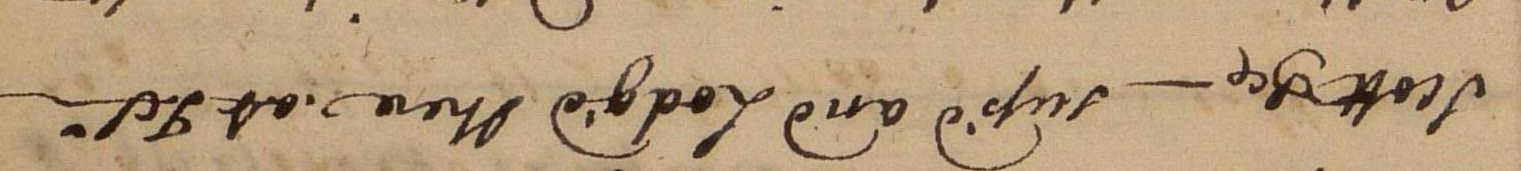Scott &c- sup'd and Lodg'd there at TS^s
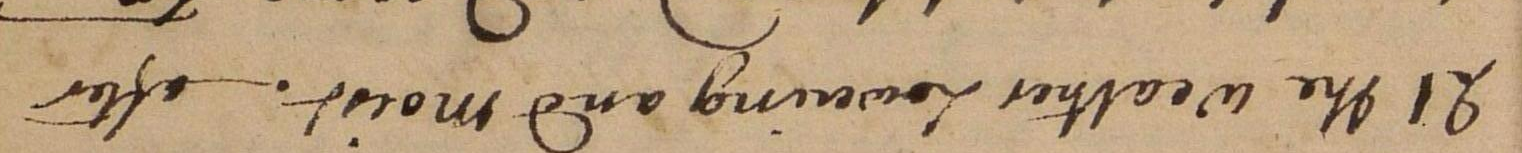21 the Weather Lowering and Moist. - after
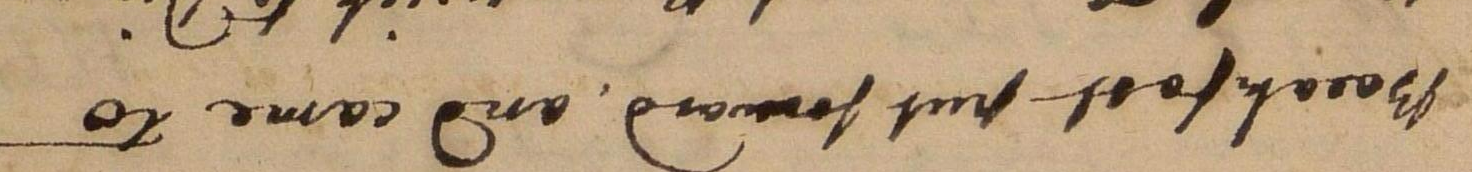Breakfast put foward, and came to
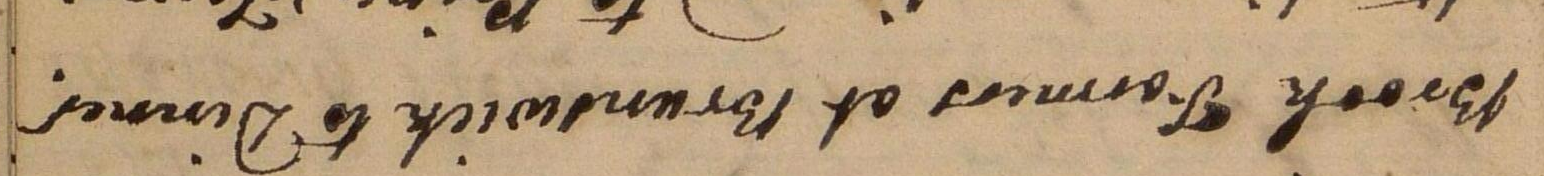Brook Farmers at Brunswick to Dinner
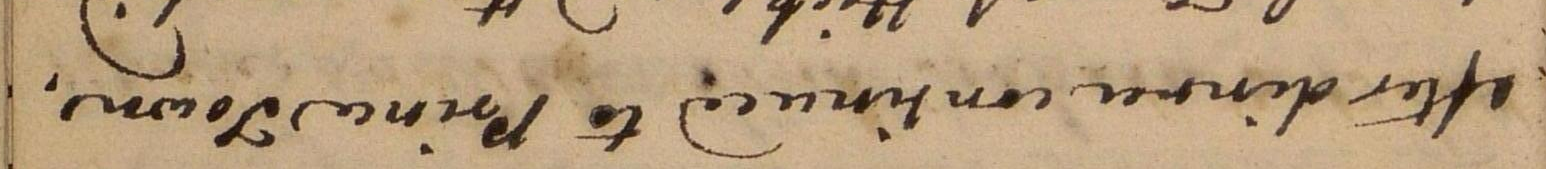after dinner continued to Prince Town,
